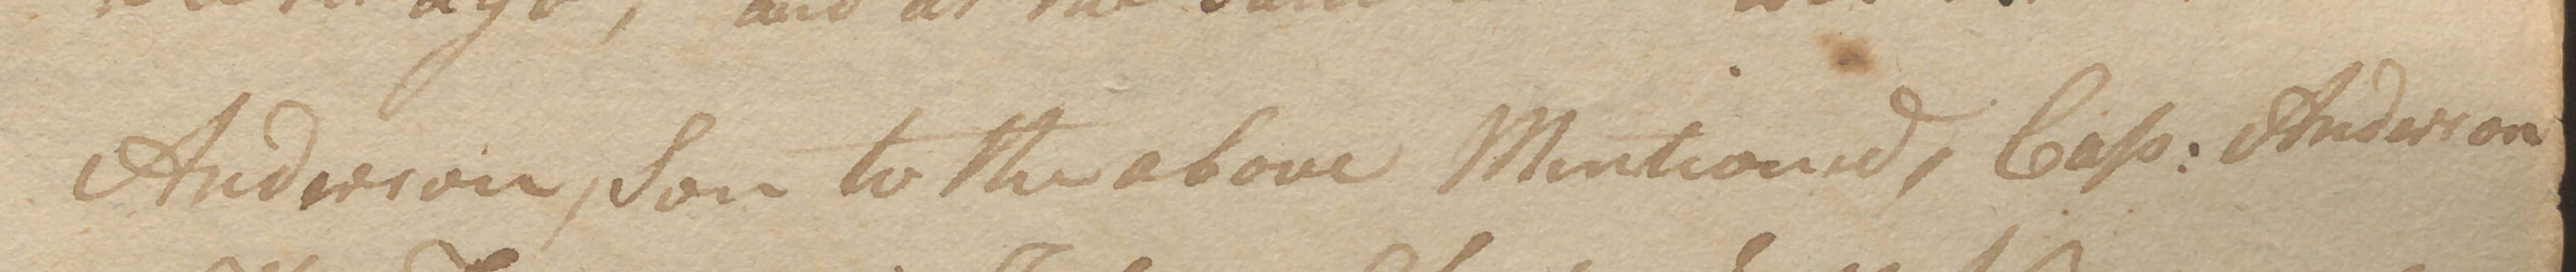Anderson, Son to the above Mentioned, Cap. Anderson
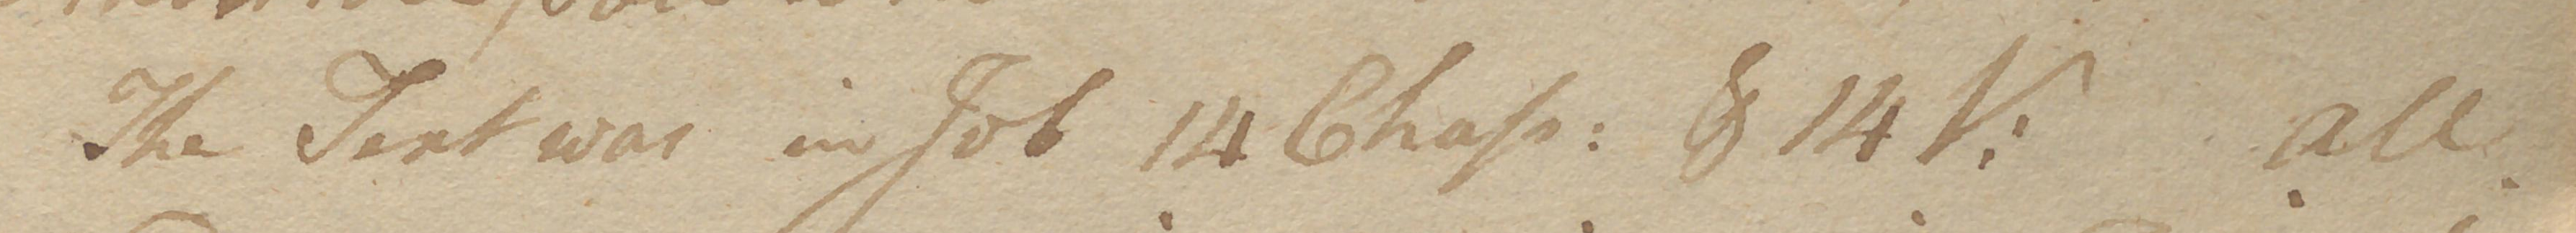The Text was in Job 14 Chap: & 14 V: all
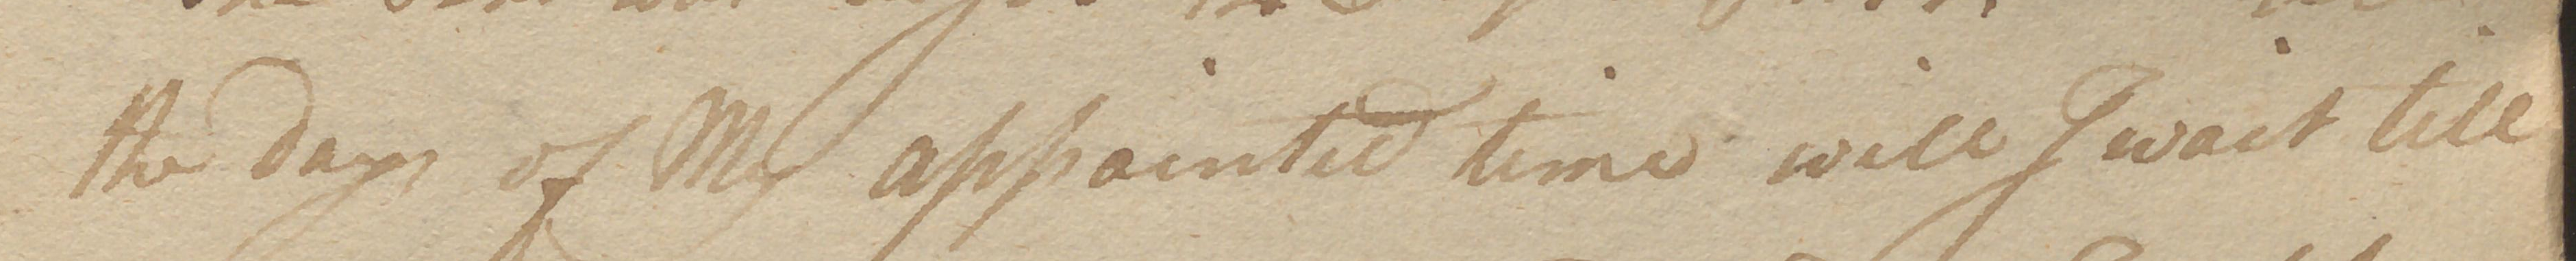the days of My appointed time will I wait till
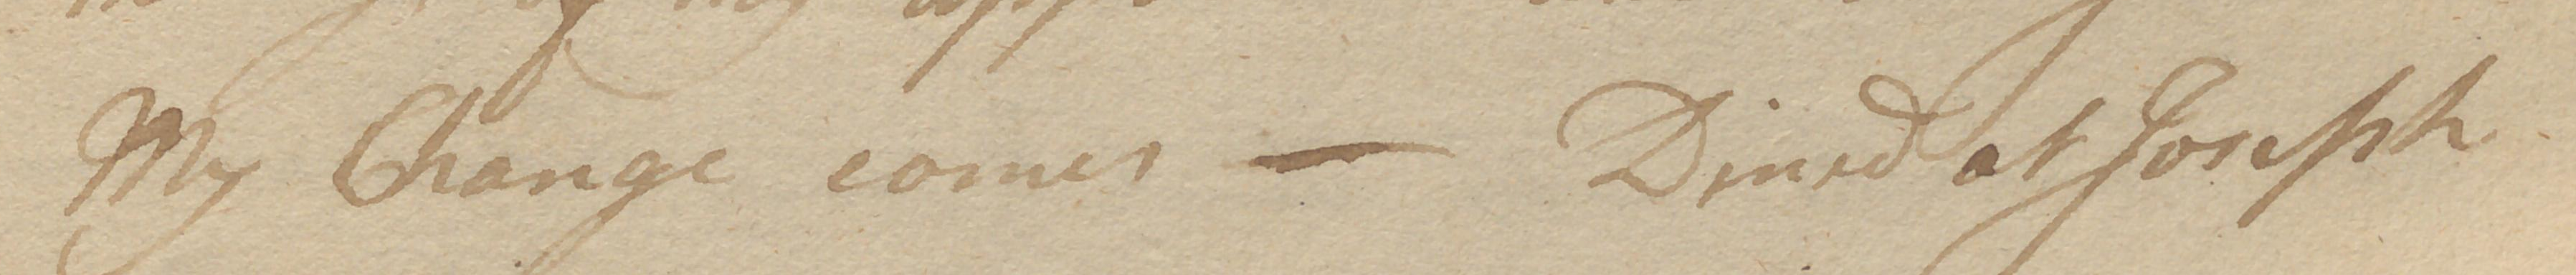My Change comes- Dined at Joseph
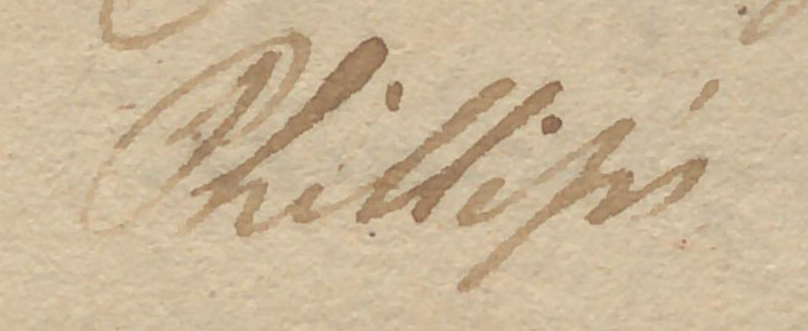Phillips
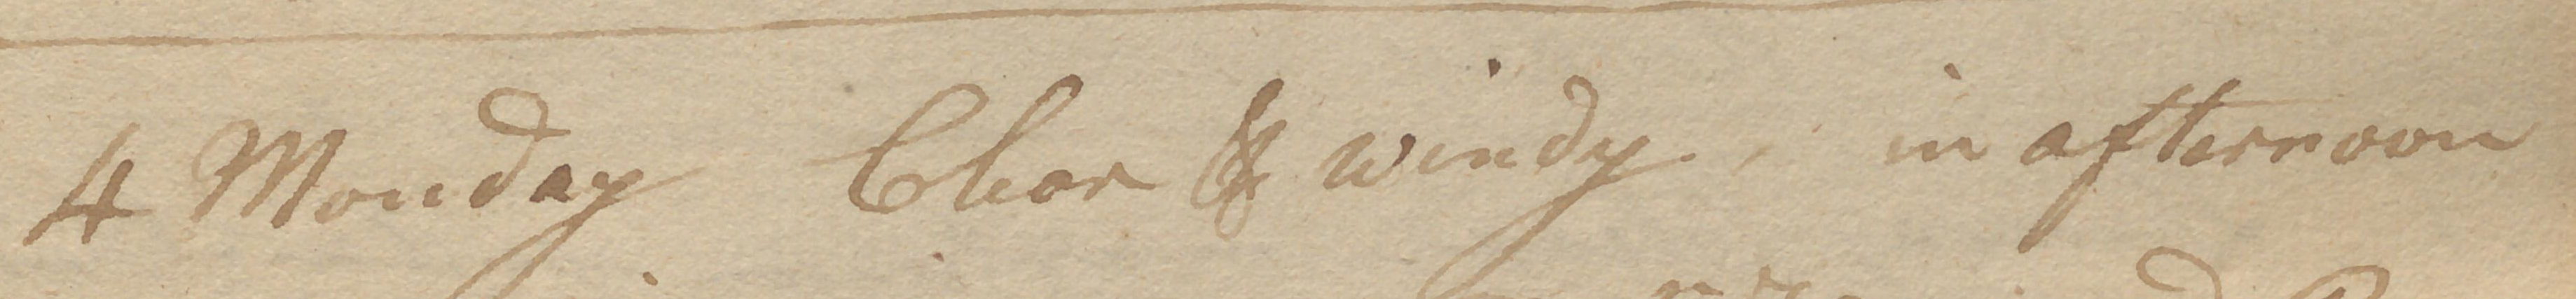4 Monday Clear & windy, in afternoon
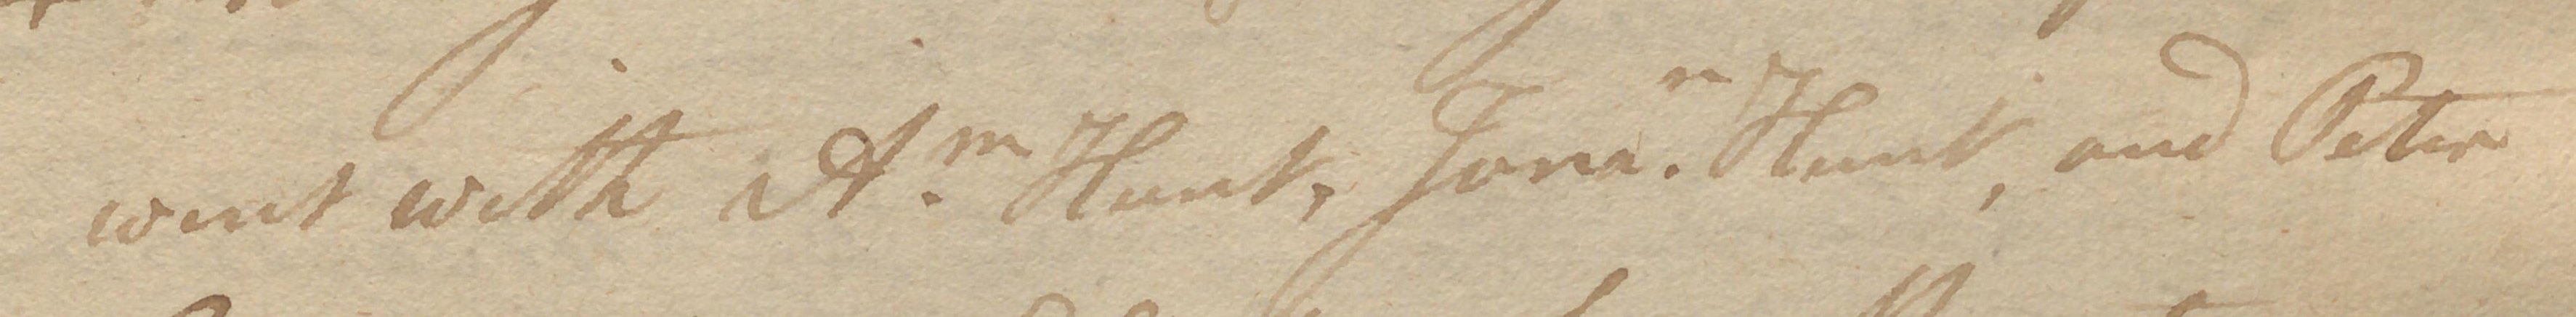went with A^m. Hunt, Jona^n. Hunt and Peter
